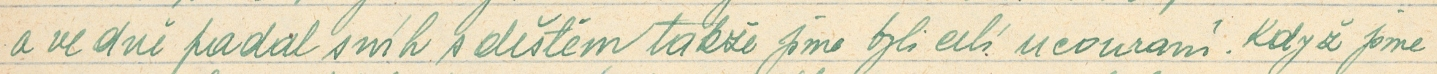a ve dně padal sníh s deštěm takže jsme byli celí ucouraní. Když jsme
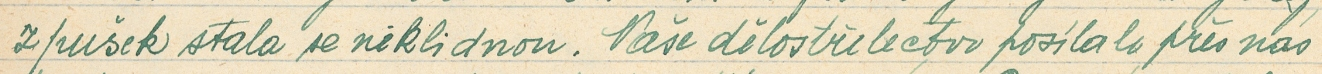z pušek stala se neklidnou. Naše dělostřelectvo posílalo přes nás
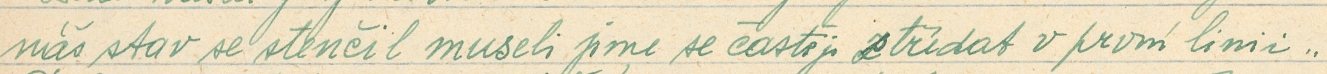náš stav se stenčil museli jsme se častěji střídat v první linii..
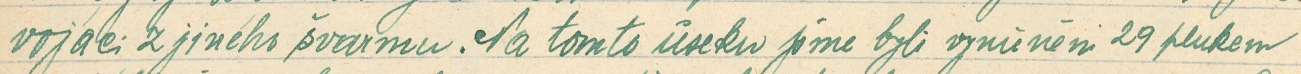vojáci z jiného švarmu. Na tomto úseku jsme byli vyměněni 29 plukem
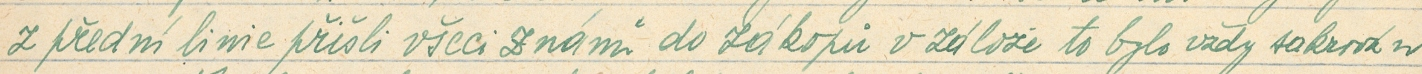z přední linie přišli všeci známí do zákopů v záloze to bylo vždy sakrování
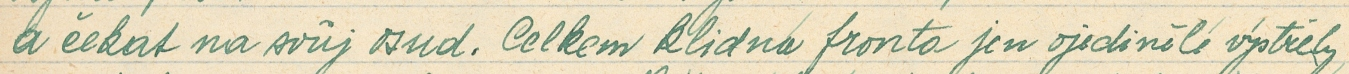a čekat na svůj osud. Celkem klidná fronta jen ojedinělé výstřely,
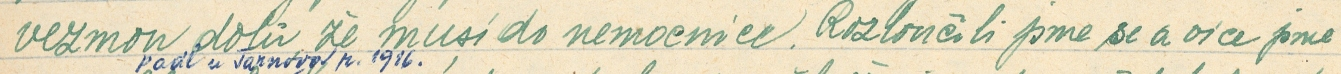vezmou dolů, že musí do nemocnice. Rozloučili jsme se a více jsme
